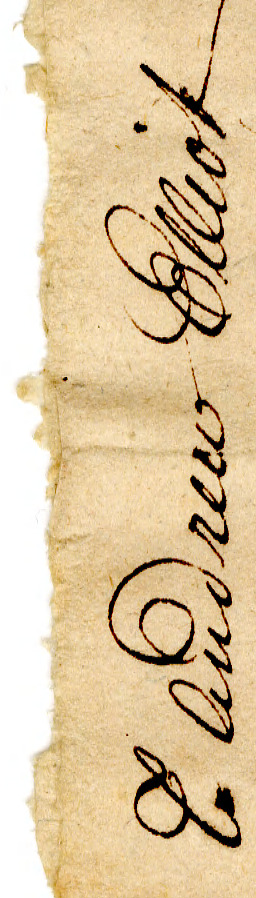To Andrew Elliot
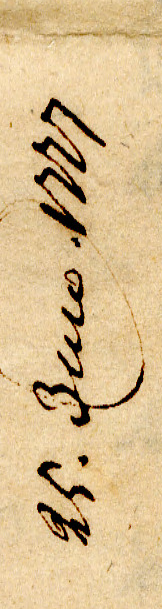25. 3mo 1777
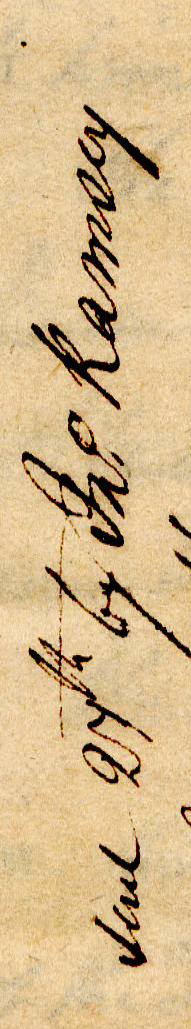sent 2^th by Jn^o. Ramsey
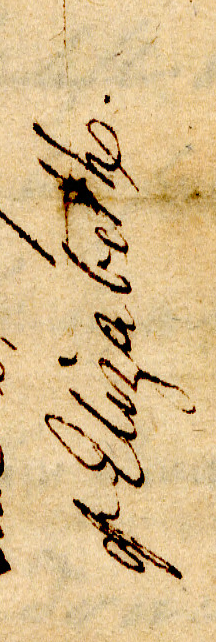of Elizabeth.
